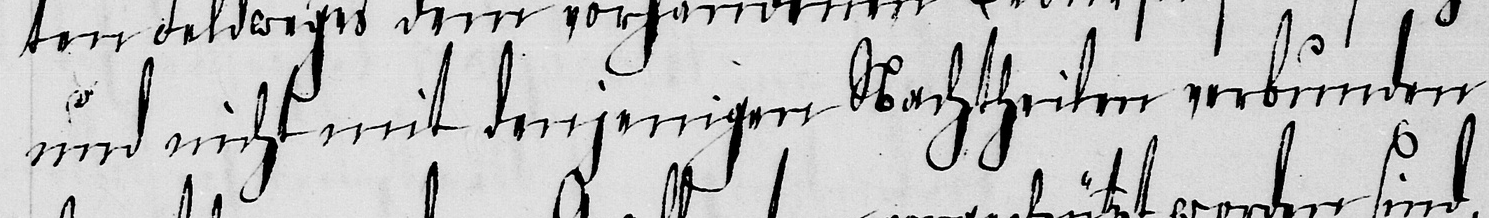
und nicht mit denjenigen Nachtheilen verbunden
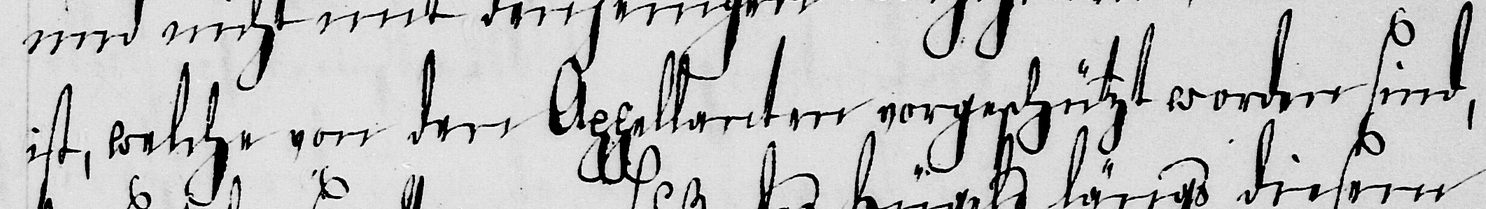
st, welche von den Appellanten vorgeschützt worden sind,
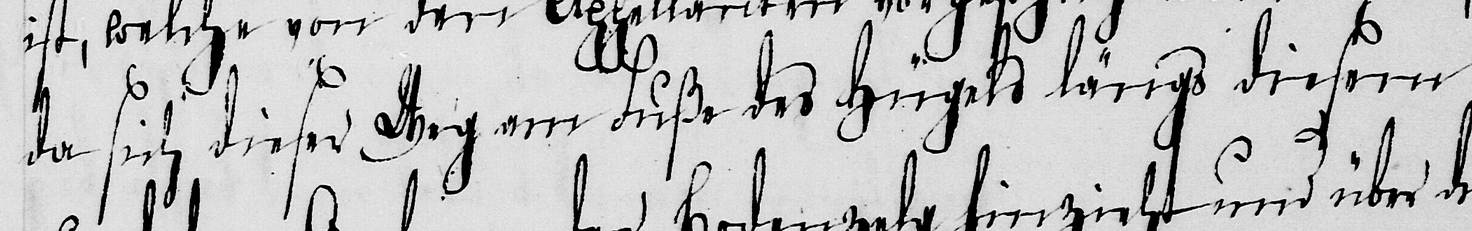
da sich dieser Weg am Fuße des Hügels längs diesem
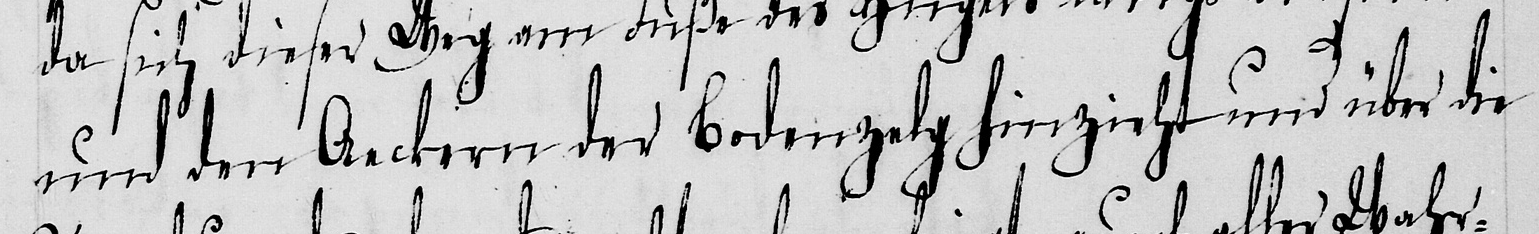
und den Aeckern der Bodenzelg hinzieht und über die
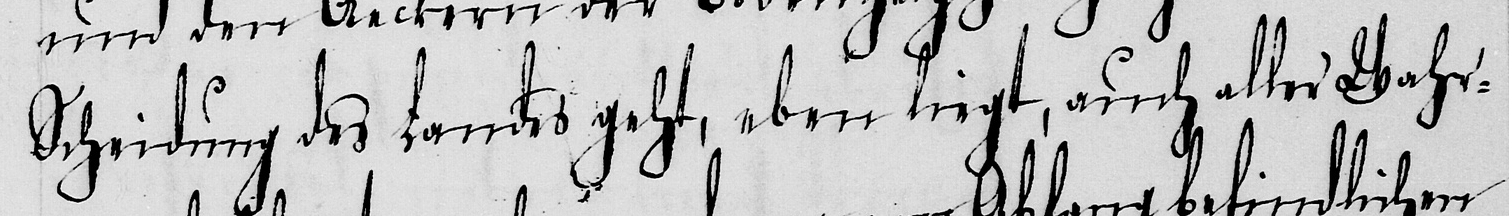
Scheidung des Landes geht, eben liegt, auch aller Wahr¬
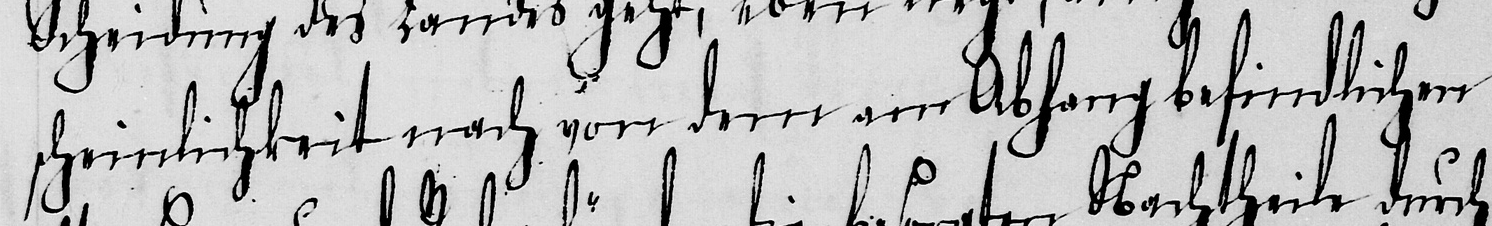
scheinlichkeit nach von dem am Abhang befindlichen
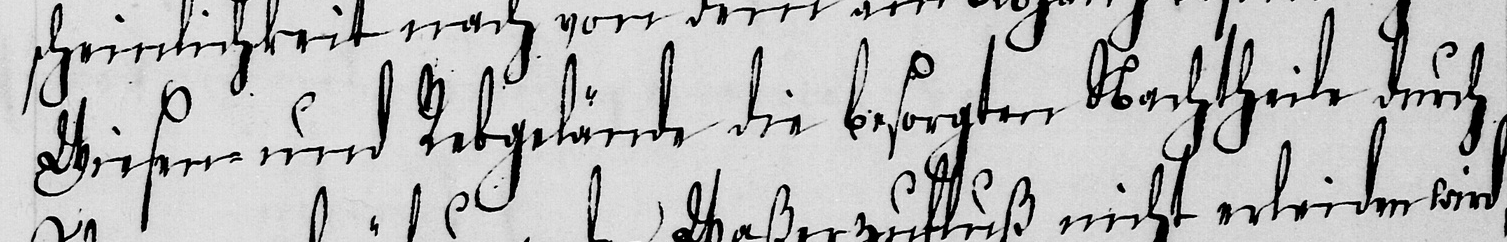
Wiesen- und Rebgelände die besorgten Nachtheile durch
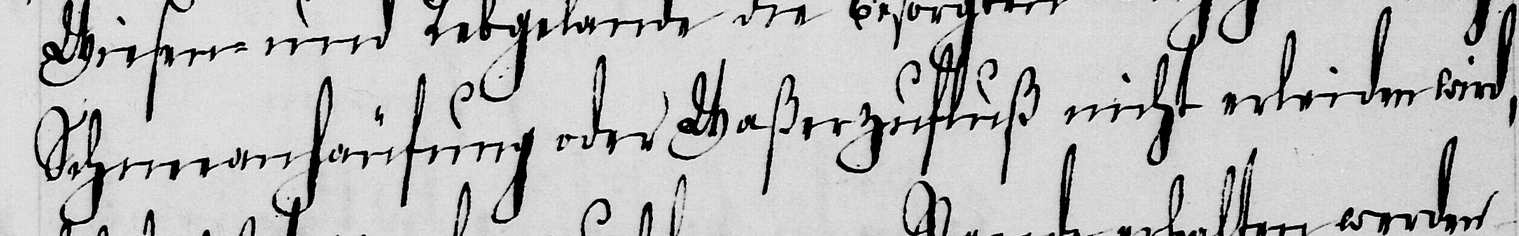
Schneeanhäufung oder Waßerzufluß nicht erleiden wir¬
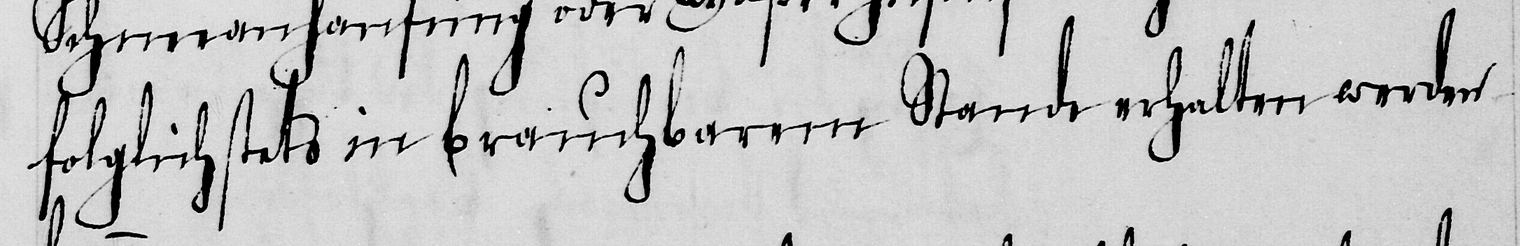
folglich stets in brauchbarem Stande erhalten werden
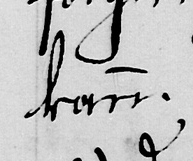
kann.
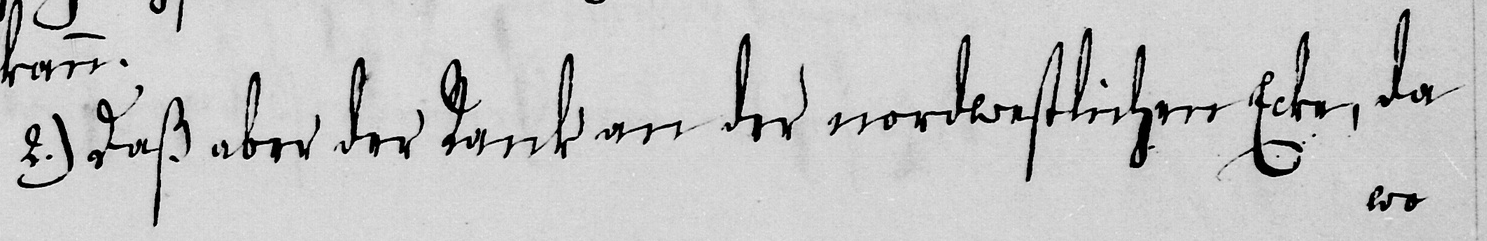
2.) Daß aber der Rank an der nordwestlichen Ecke, da
